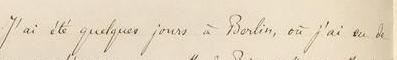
J'ai été quelques jours à Berlin, où j'ai eu de
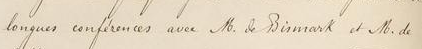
longues conférences avec M. de Bismark et M. de
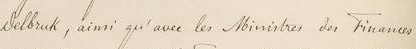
Delbruk, ainsi qu'avec les Ministres des Finances
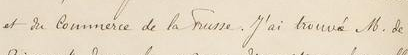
et du Commerce de la Prusse. J'ai trouvé M. de
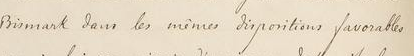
Bismark dans les mêmes dispositions favorables
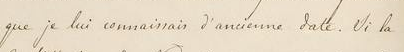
que je lui connaissais d'ancienne date. Si la
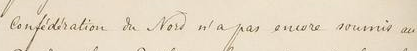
Confédération du Nord n'a pas encore soumis au
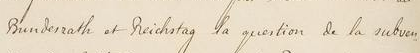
Bundesrath et Reichstag la question de la subven-
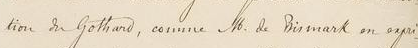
tion du Gothard, comme M. de Bismark en expri-
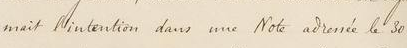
mait l'intention dans une Note adressée le 30
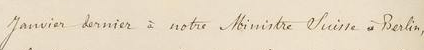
Janvier dernier à notre Ministre Suisse à Berlin,
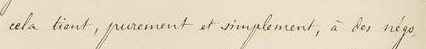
cela tient, purement et simplement, à des négo-
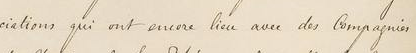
ciations qui ont encore lieu avec des Compagnies
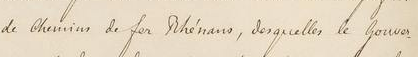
de Chemins de fer Rhénans, desquelles le Gouver-
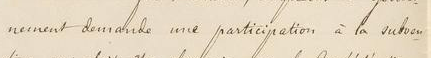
nement demande une participation à la subven-
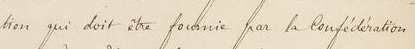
tion qui doit être fournie par la Confédération
